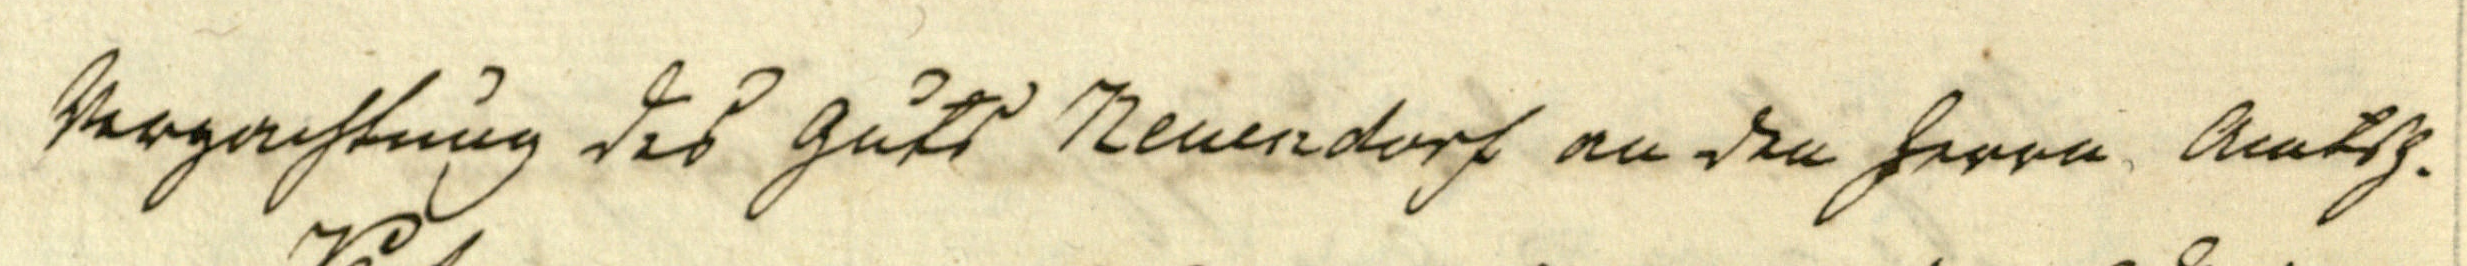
Verpachtung des Guts Neuendorf an den Herrn Amtsh.
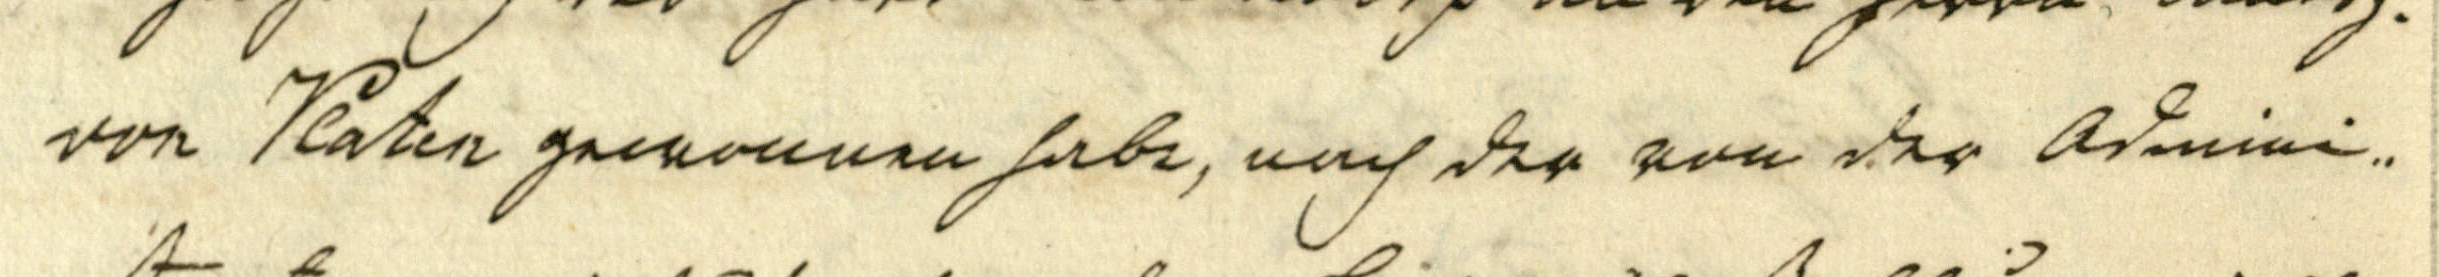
von Platen gewonnen habe, nach der von der Admini¬
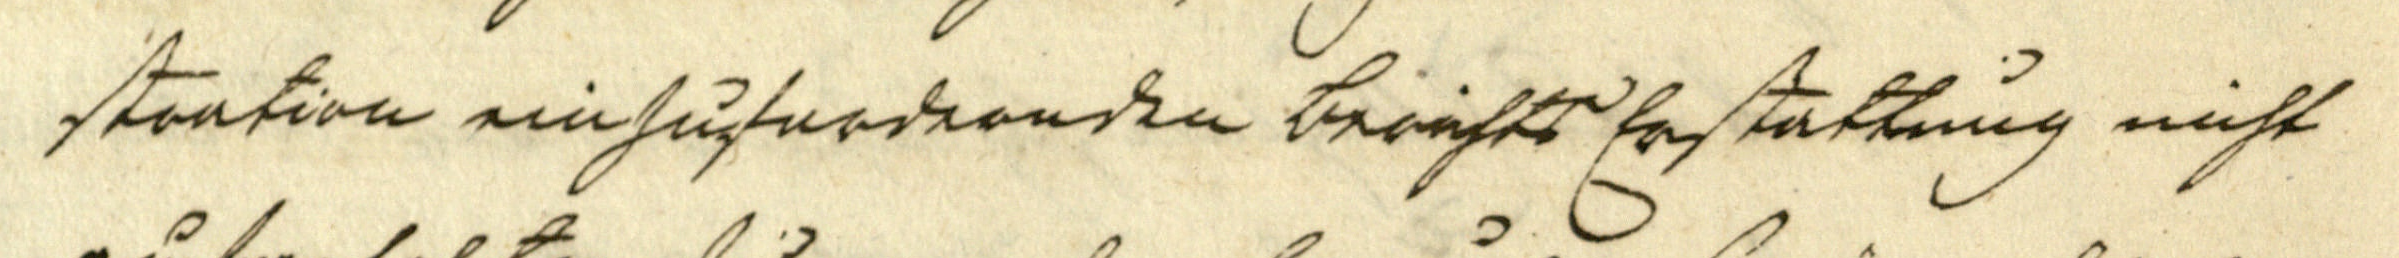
stration einzufordernden Berichts Erstattung nicht
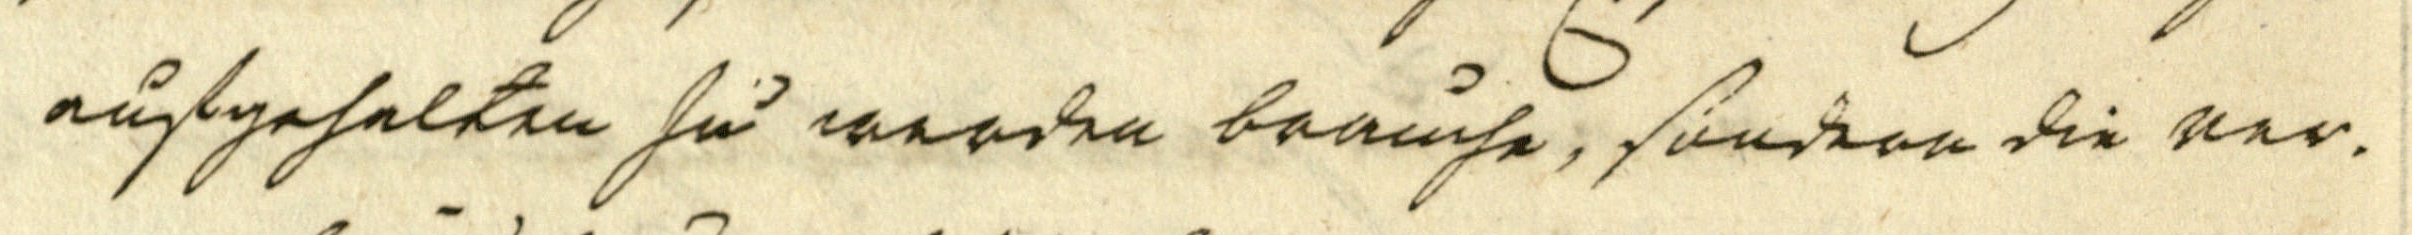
aufgehalten zu werden brauche, sondern die ver¬
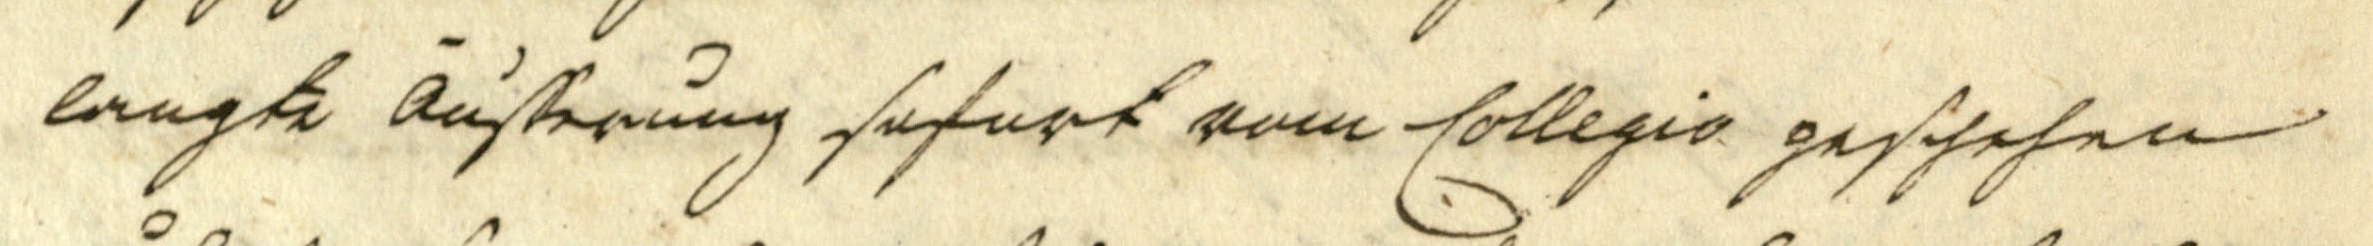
langte Äusserung sofort vom Collegio geschehen
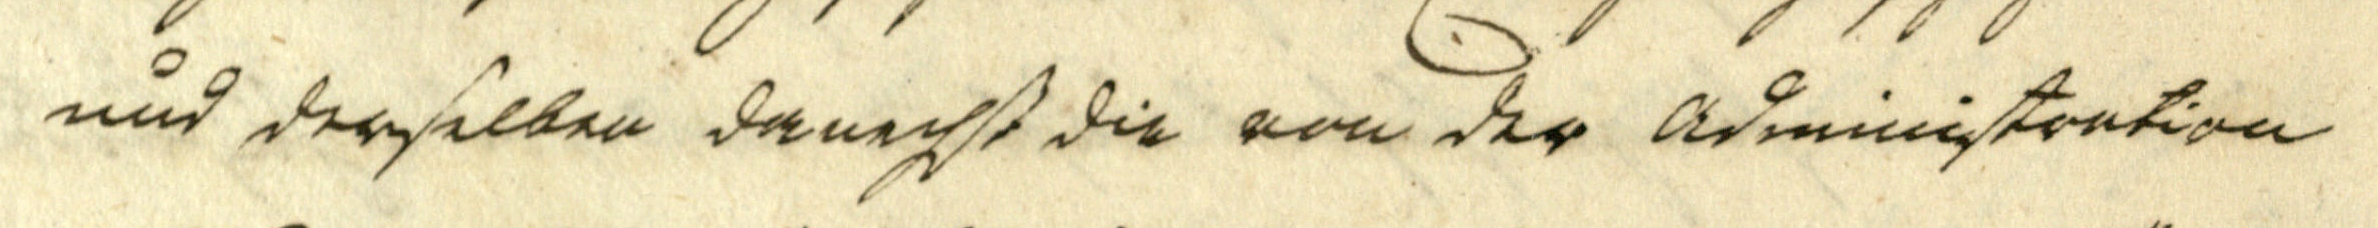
und derselben danechst die von der Administration
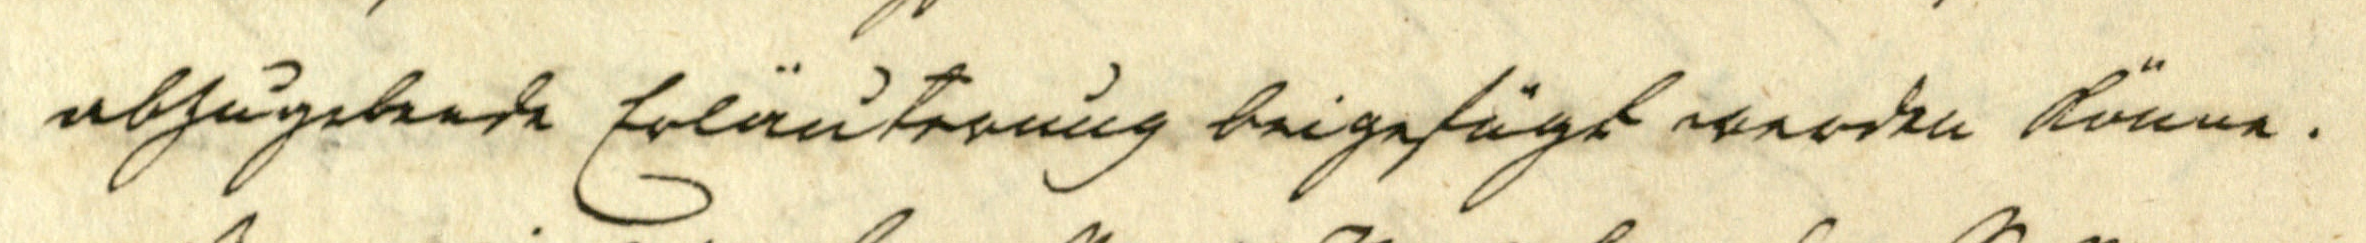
abzugebende Erläuterung beigefügt werden könne.
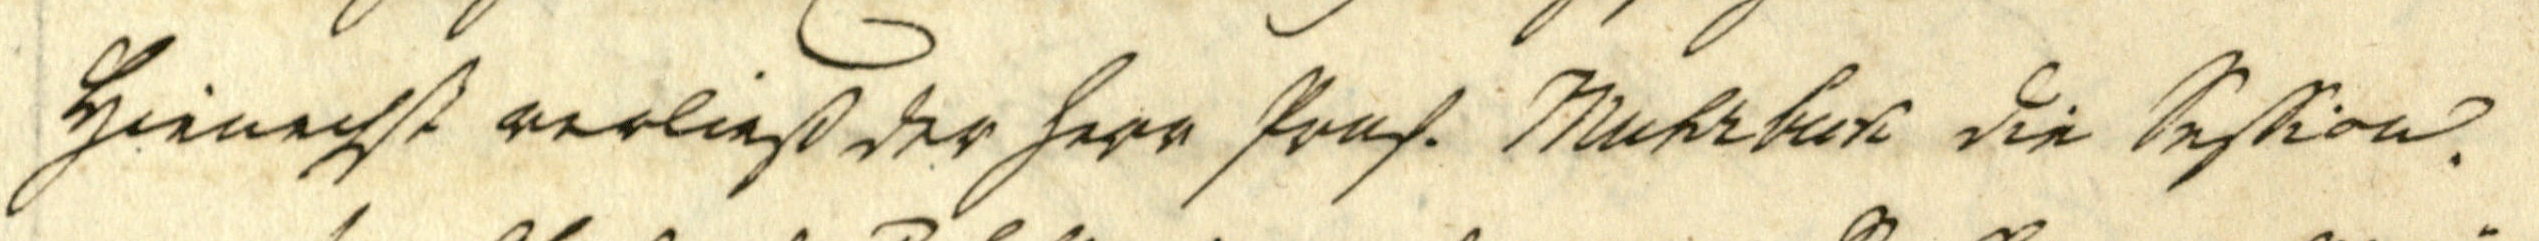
Hienechst verließ der Herr Prof. Muhrbeck die Session.
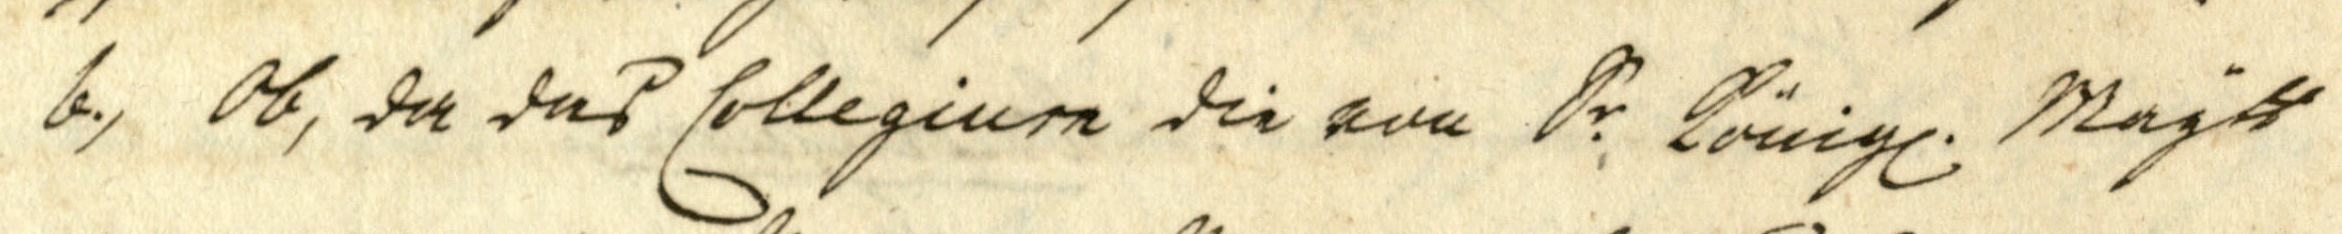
b., Ob, da das Collegium die von Sr Königl. Maÿtt.
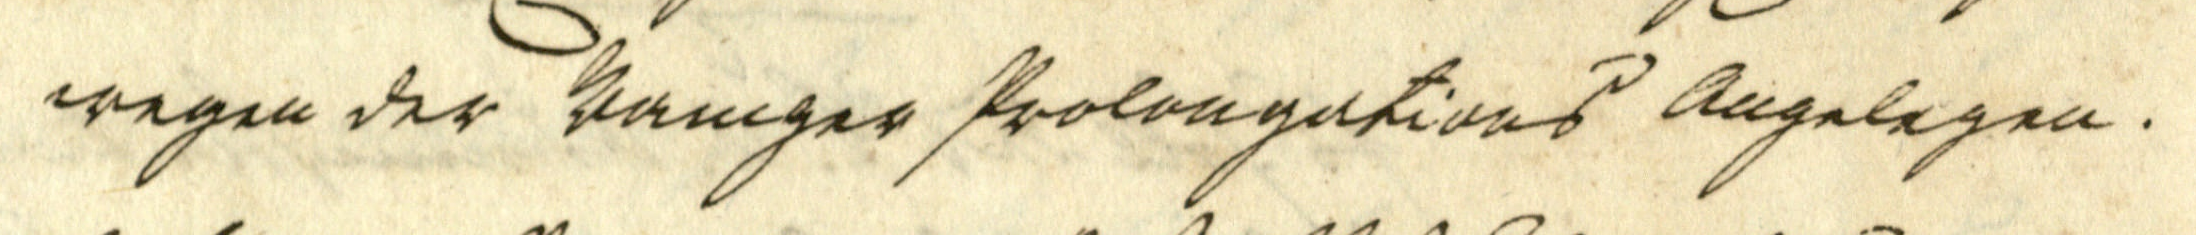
wegen der Wamper Prolongations Angelegen¬
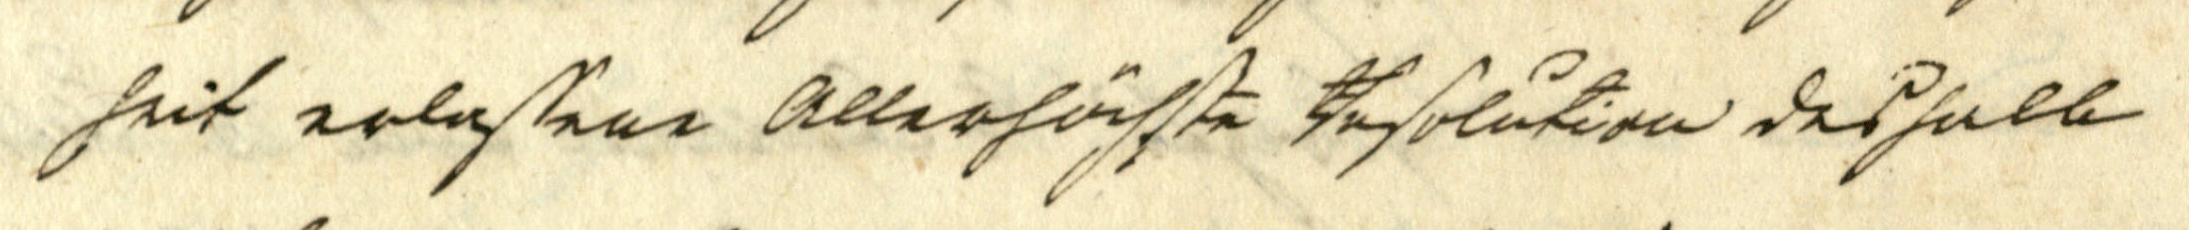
heit erlassene Allerhöchste Resolution deshalb
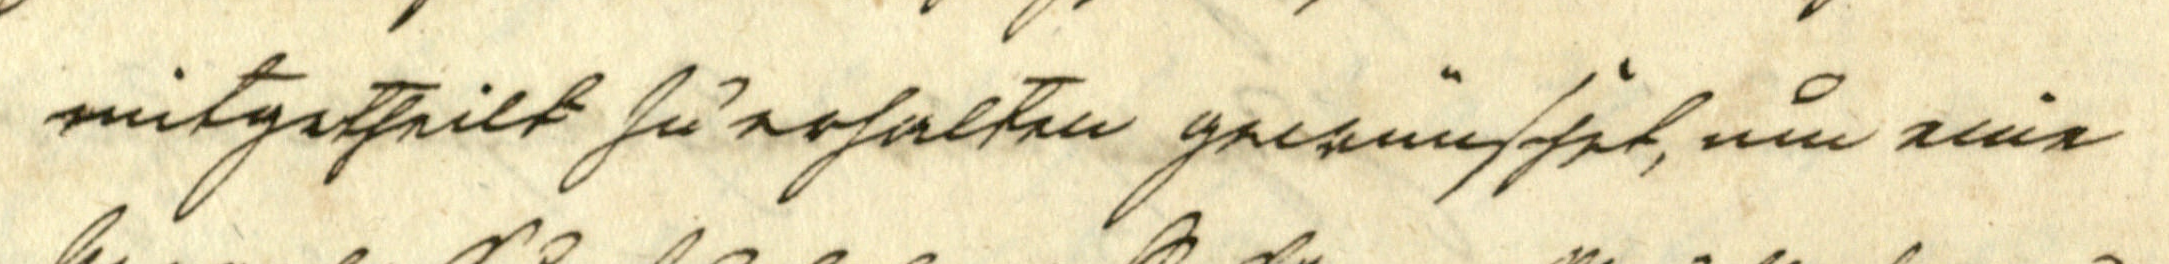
mitgetheilt zu erhalten gewünschet, um eine
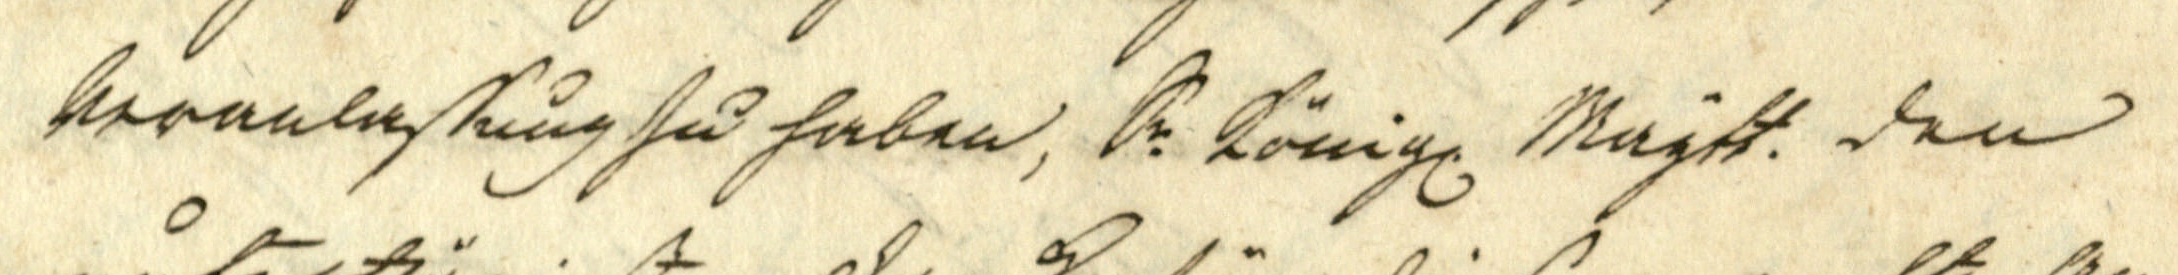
Veranlassung zu haben, Sr Königl. Maÿtt. den
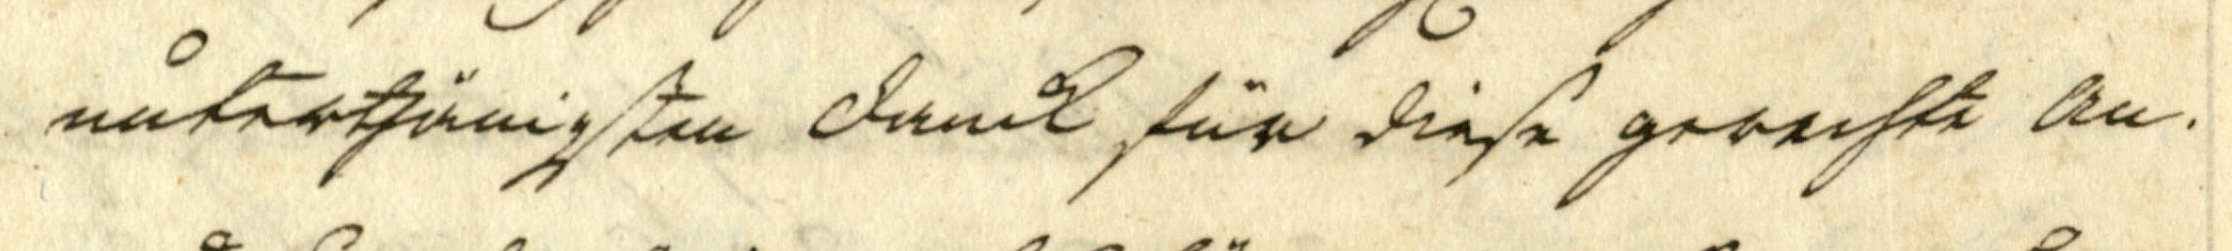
unterthänigsten Danck für diese gerechte An¬
